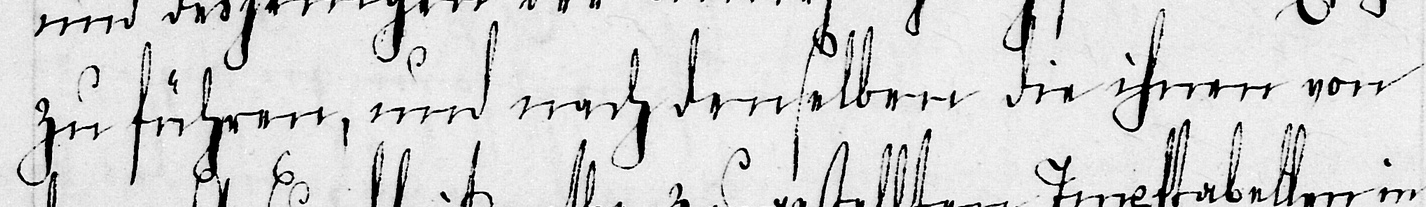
zu führen, und nach denselben die ihnen von
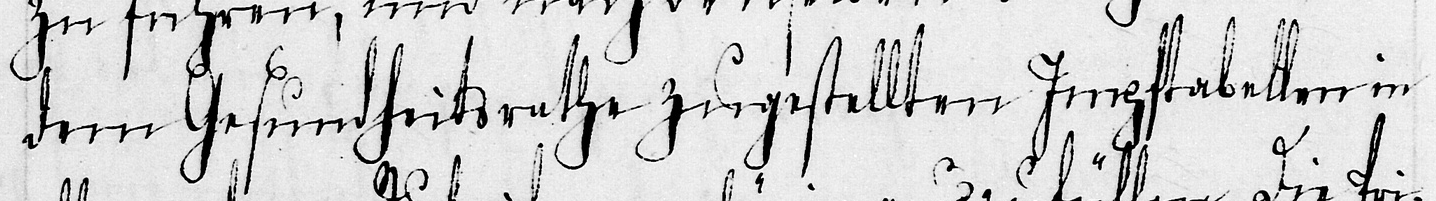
dem Gesundheitsrathe zugestellten Impftabellen in
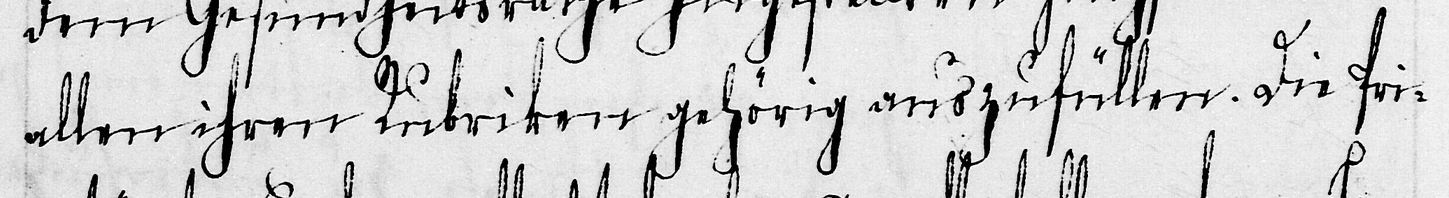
allen ihre Rubriken gehörig auszufüllen. Die Pri¬
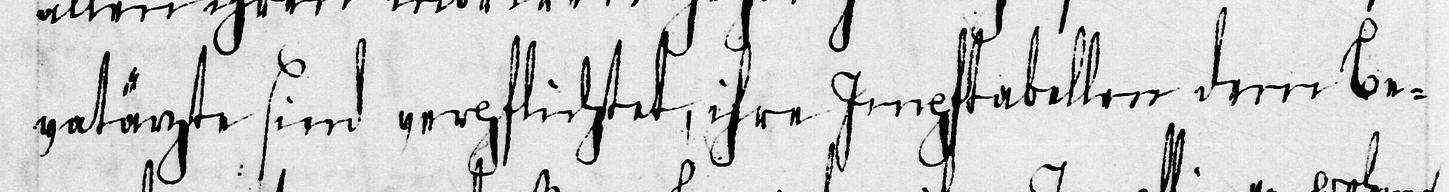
vatärzte sind verpflichtet, ihre Impftabellen dem Be¬
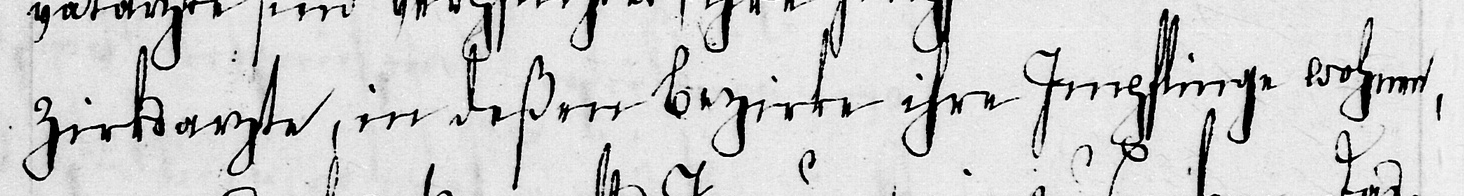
zirksarzte, in deßen Bezirke ihre Impflinge wohnen,
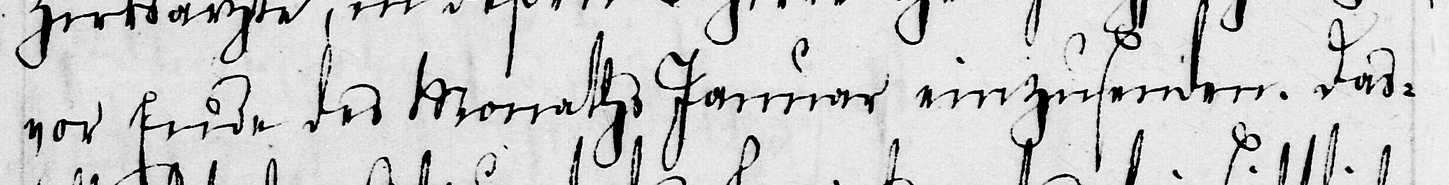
vor Ende des Monaths Januar einzusenden. Daß¬
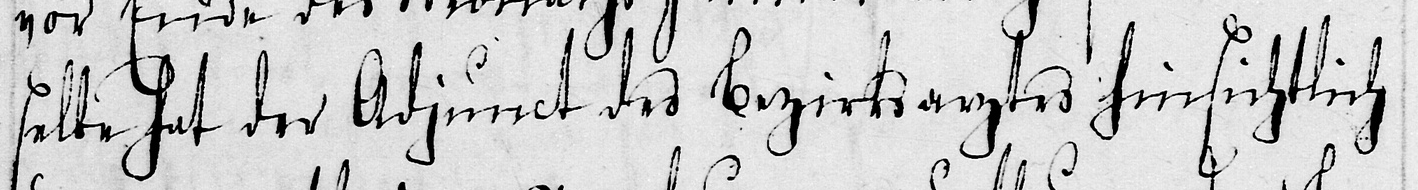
elbe hat der Adjunct des Bezirksarztes hinsichtlich
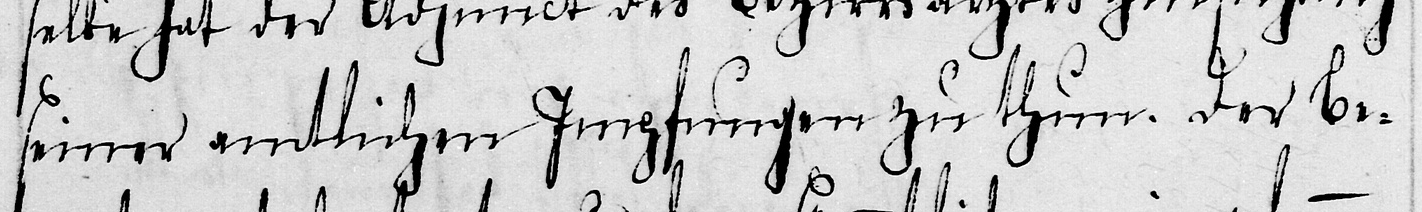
seiner amtlichen Impfungen zu thun. Der Be¬
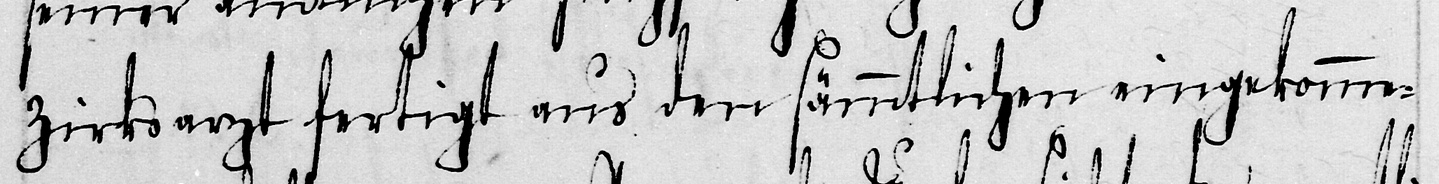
zirksarzt fertigt aus den sämmtlichen eingekomme¬
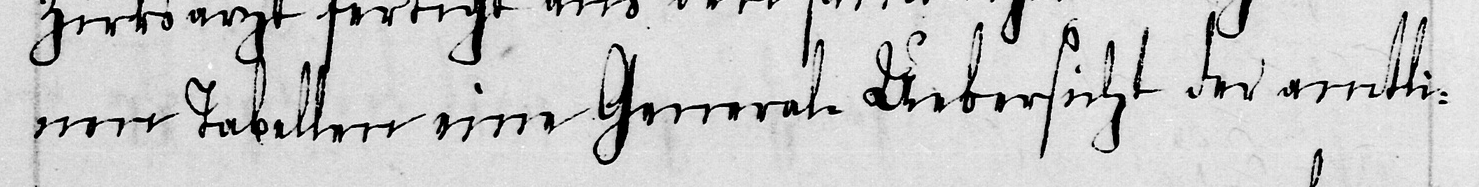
nen Tabellen eine General-Uebersicht der amtli-
